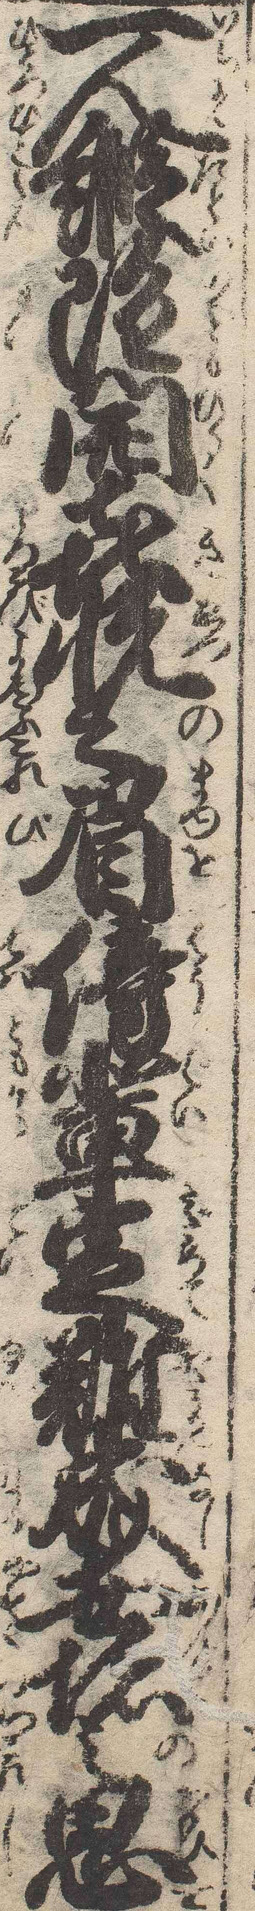一人縦雖開喜悦之眉傍輩定難成安堵之思
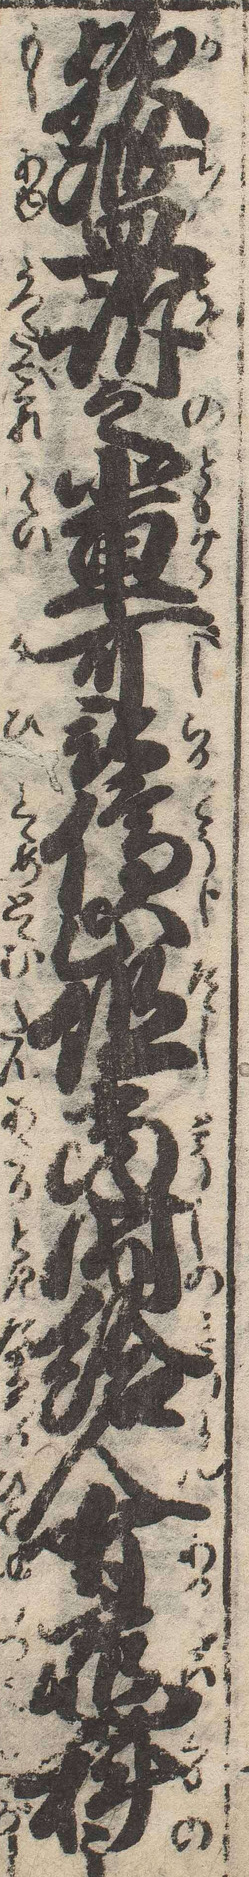欤濫訴之輩可被停止但當時給人有罪科之
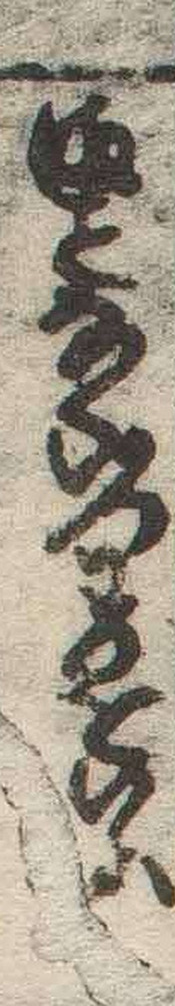不実まことなくいつわりをいふ
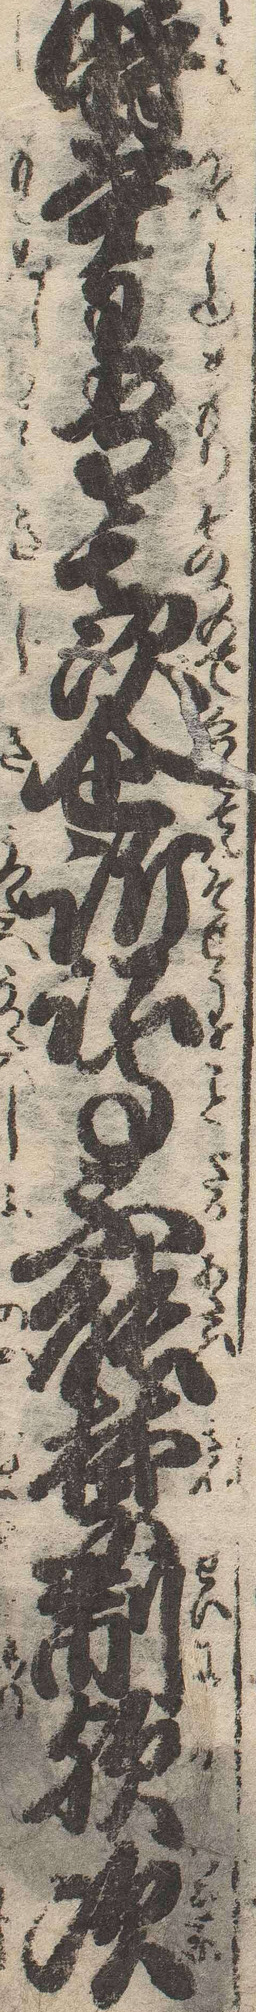時本主守其次企訴訟事不能禁制欤次
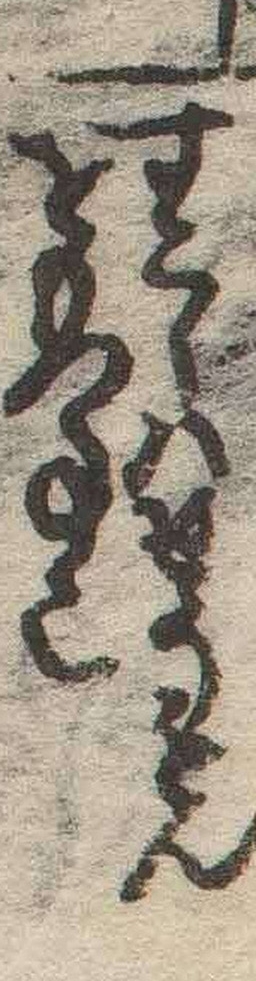をもつ事也
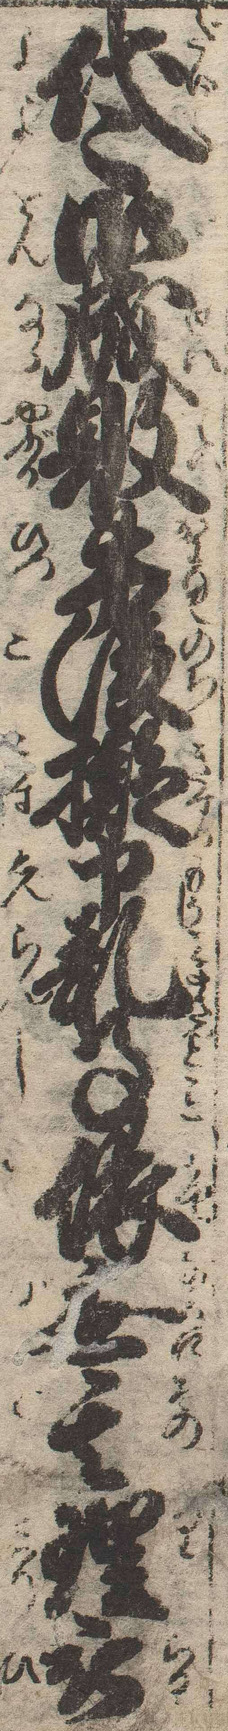代々御成敗畢後擬申乱事依無其理被
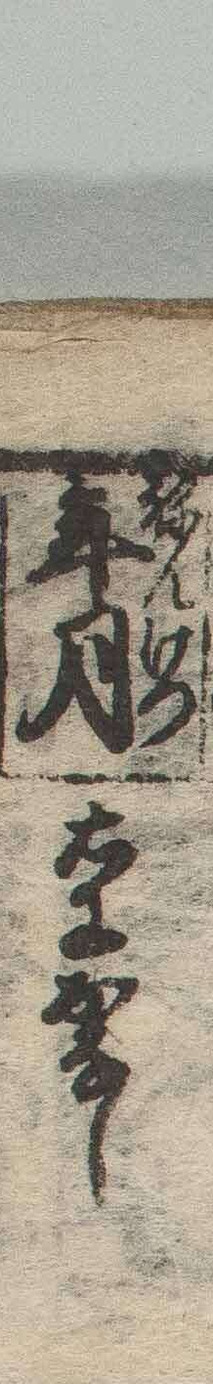年月右におなし
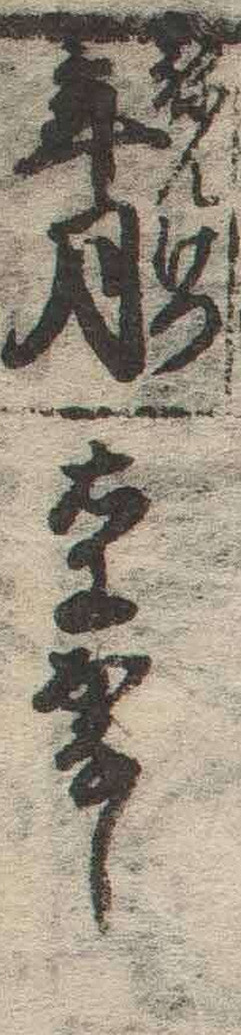年月右におなし
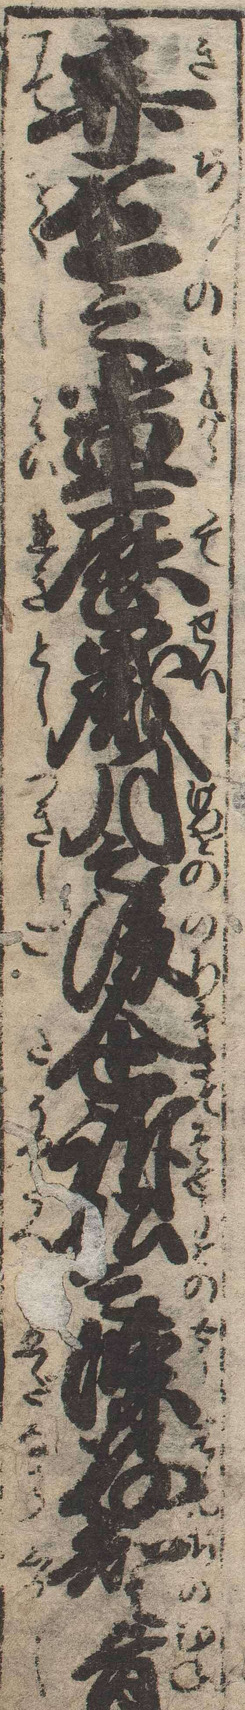棄置之輩歴歳月之後企訴訟之條存知之旨

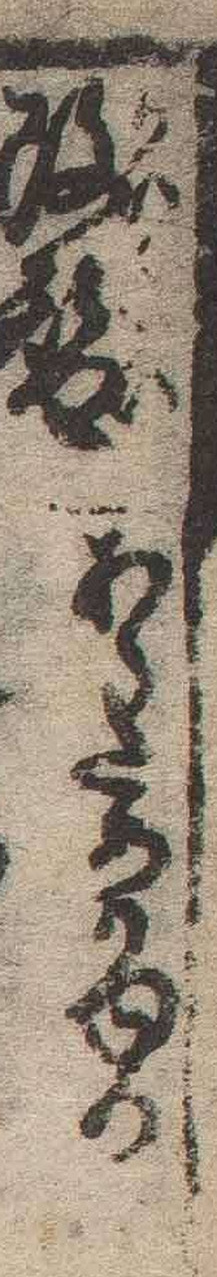改替あらためかゆる
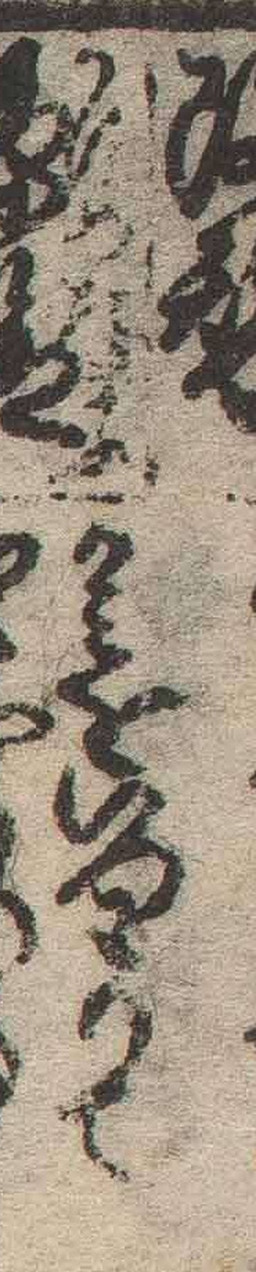掠給かみをいつわりて
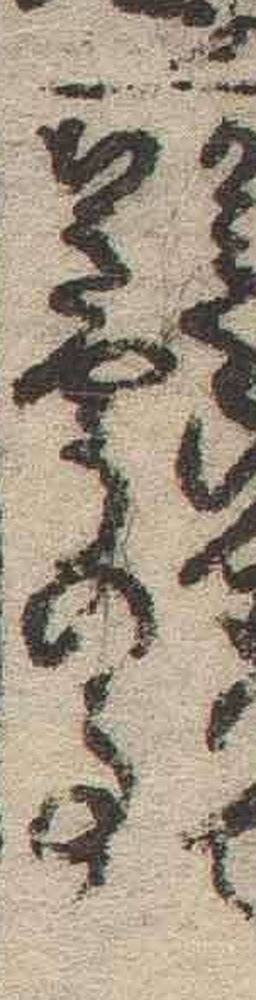ちきやうの事
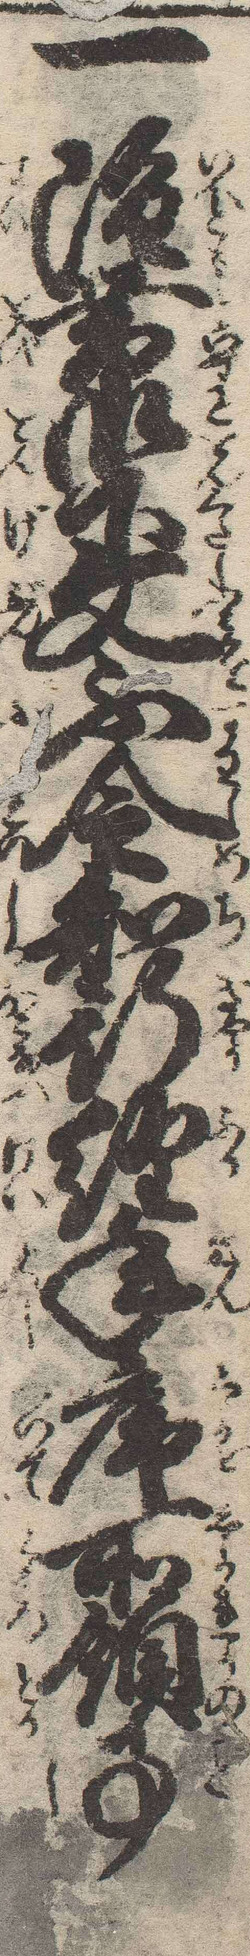一雖帯御下文不令知行經年序所領事
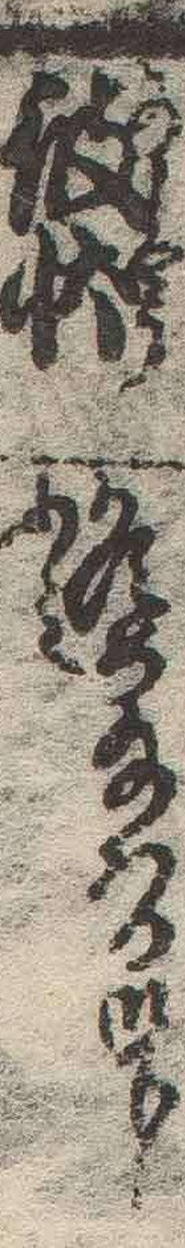彼状かすめ給はる御下し
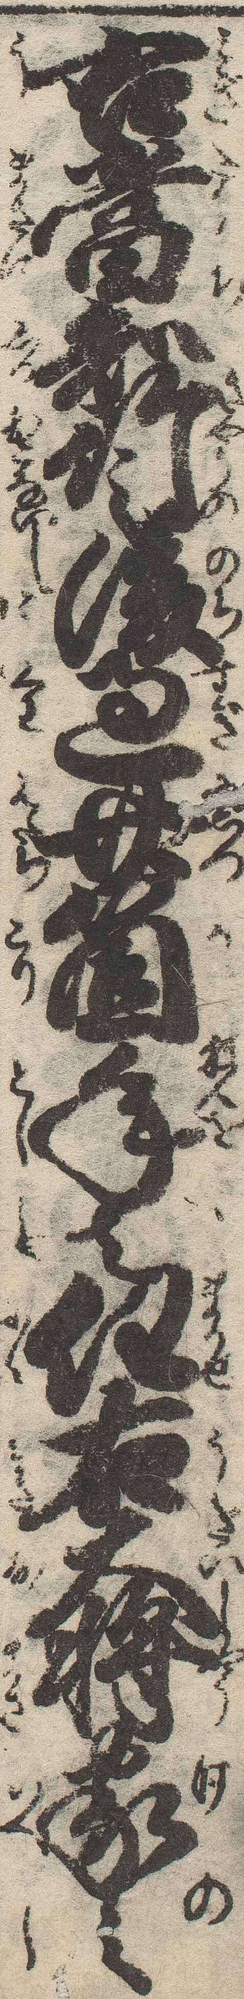右當知行之後過廿箇年者任右大将家之
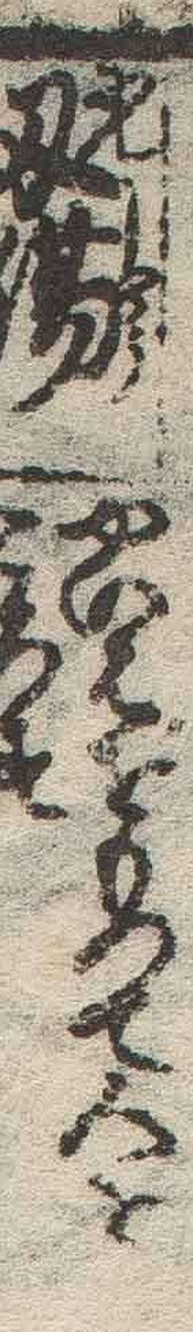刃傷やいはをもつて人を
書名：御成敗式目絵抄
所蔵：東京学芸大学附属図書館 国文学研究資料館
